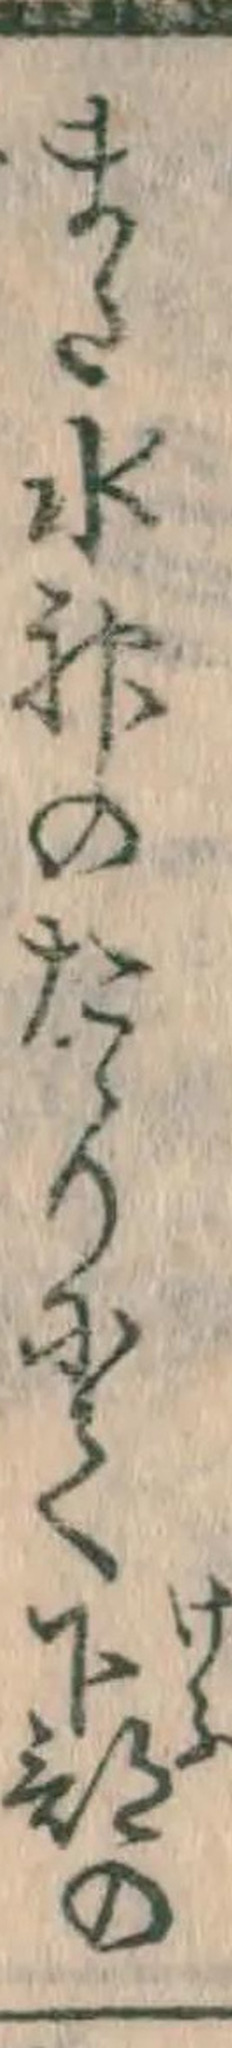また水神のたゝりにて下部の
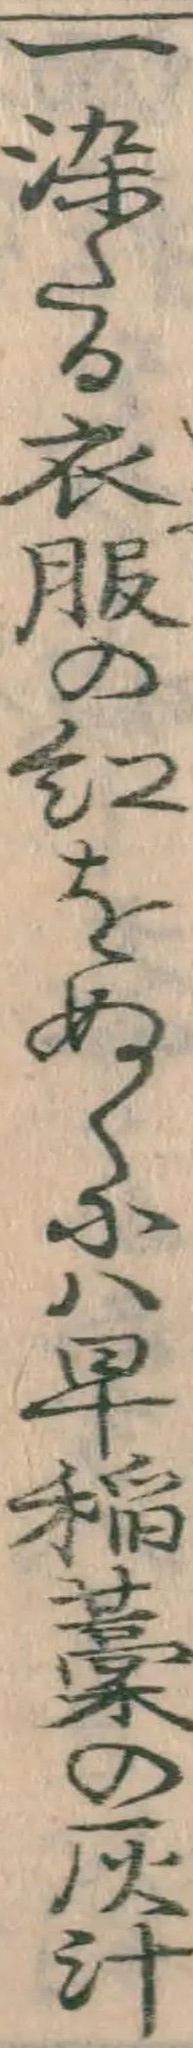一染たる衣服の紅をぬくには早稲藁の灰汁
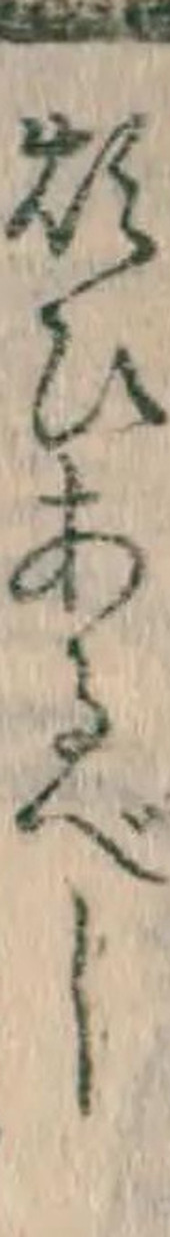煩ひあるべし
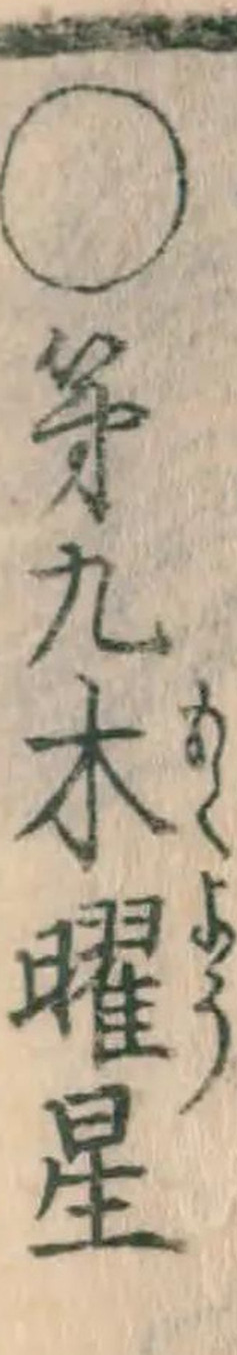○第九木曜星
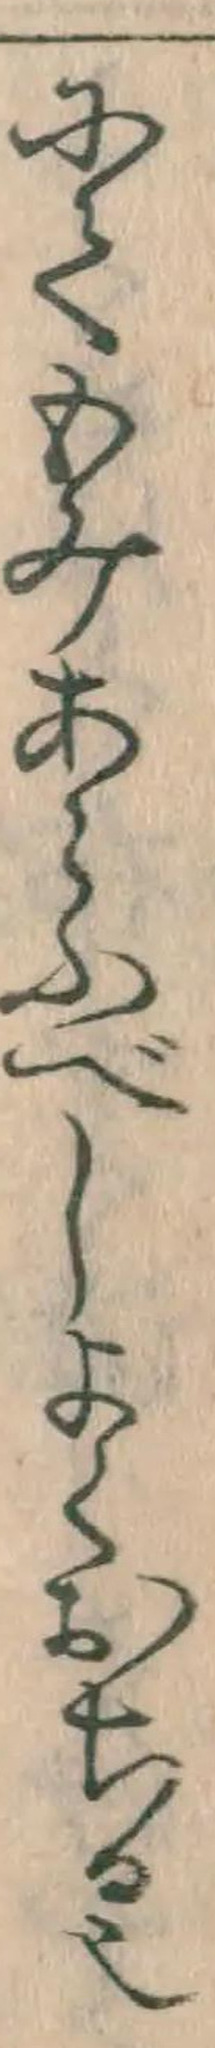にてもみあらふべしよくおちる也
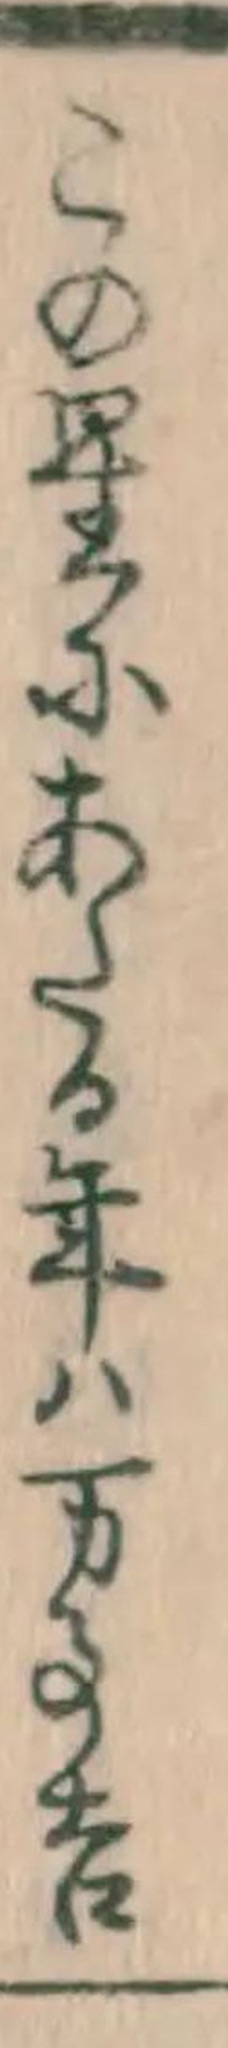この星にあたる年は万事吉
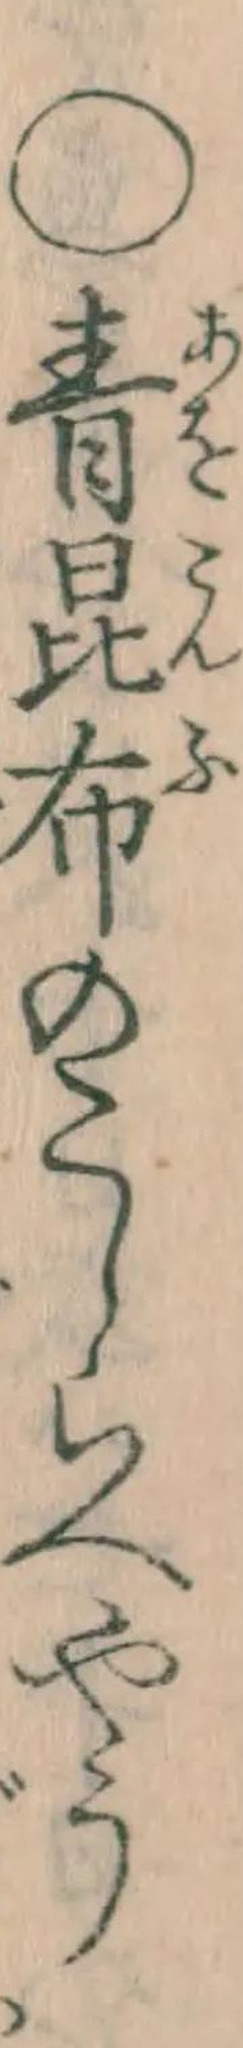○青昆布のこしらへやう
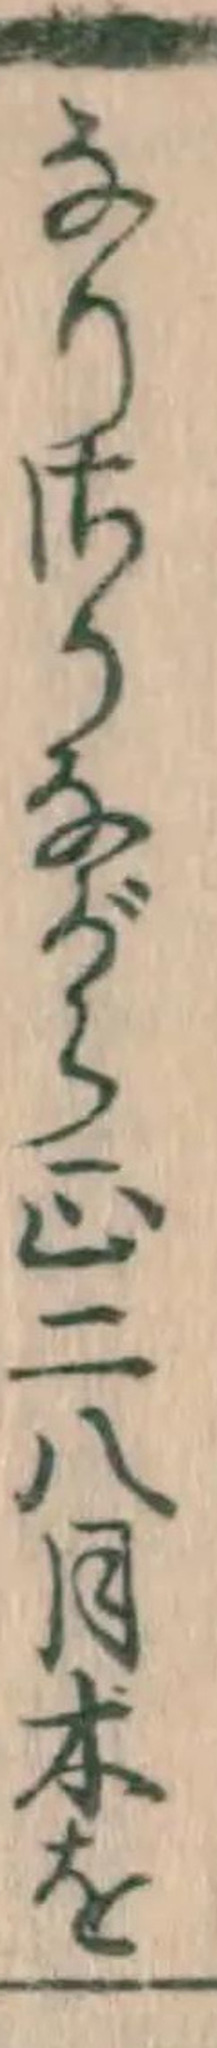なりさりながら正二八月木を
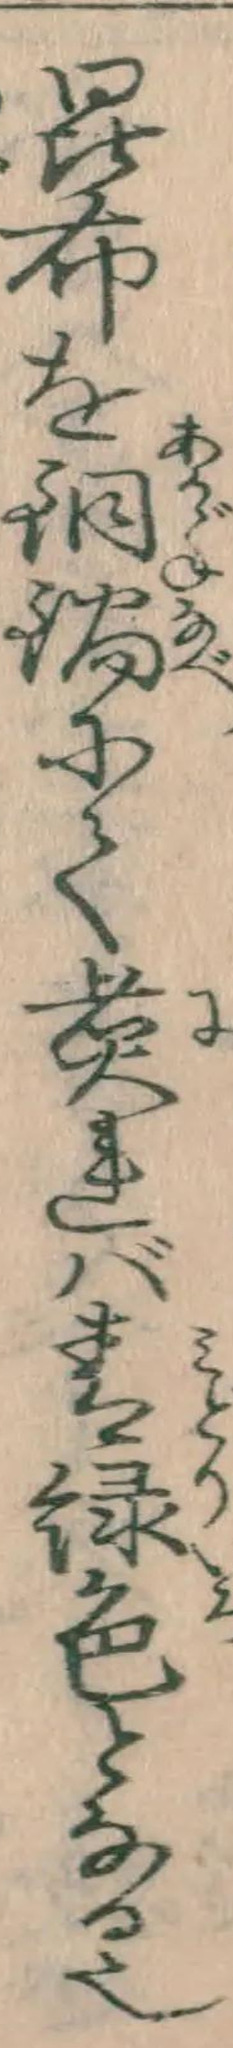昆布を銅鍋にて煮れば青緑色となる也
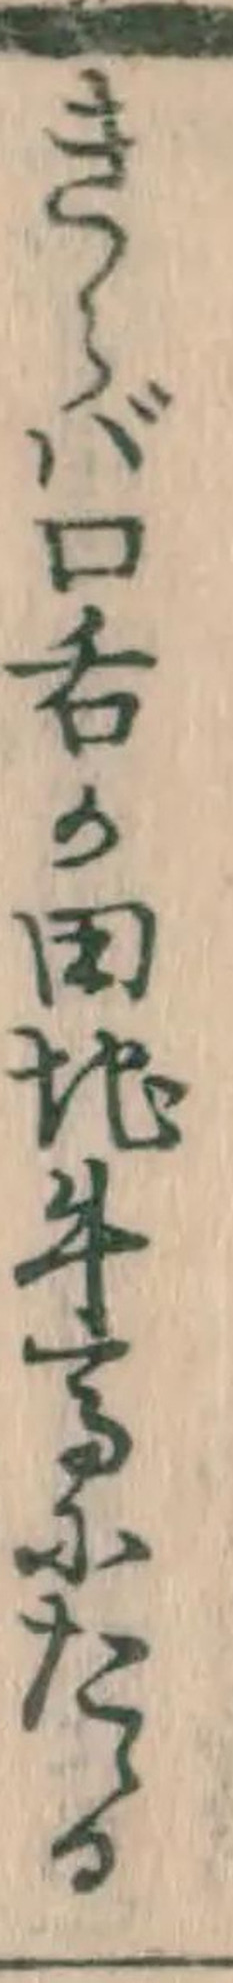きらば口舌の田地牛馬にたゝる
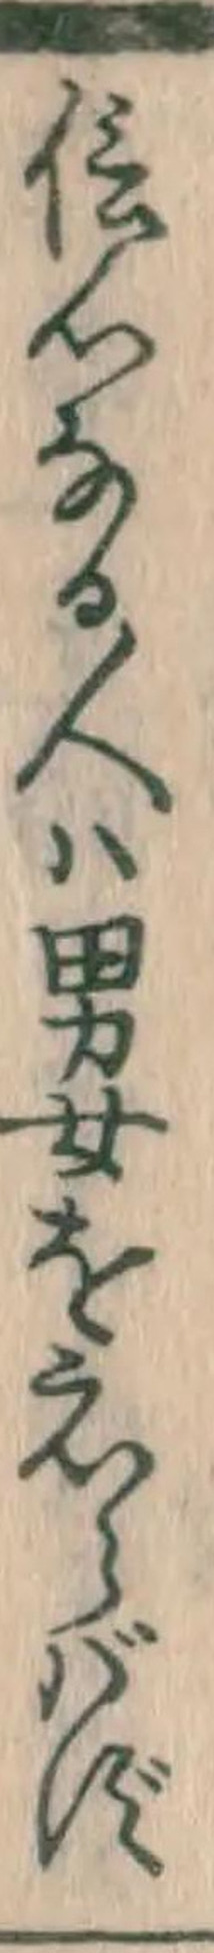信心なる人は男女をえらばず
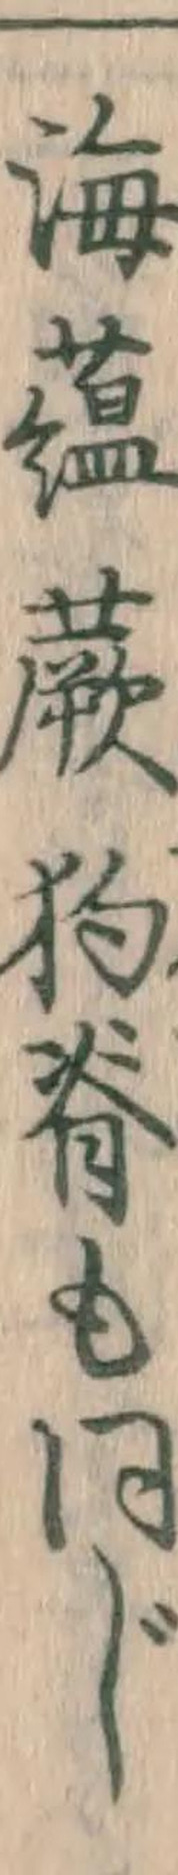海蘊蕨狗脊も同じ
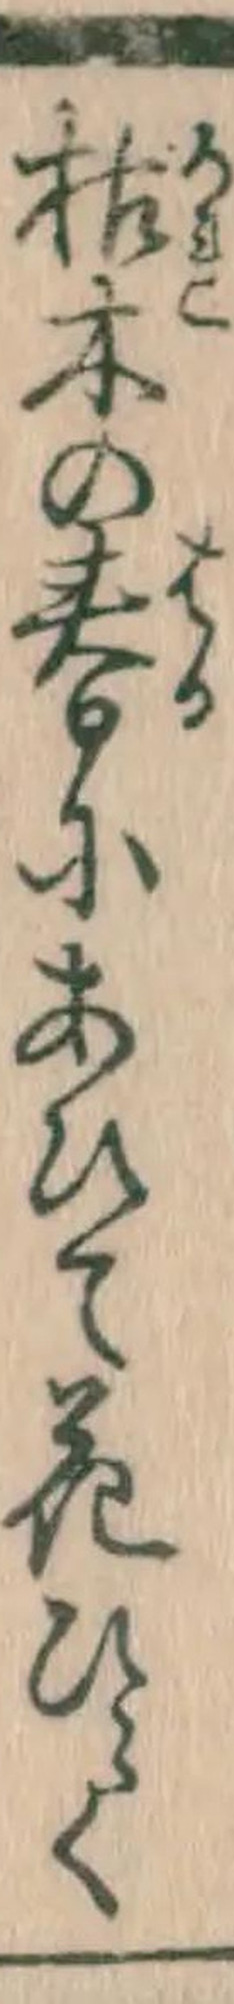枯木の春にあひて花ひらく
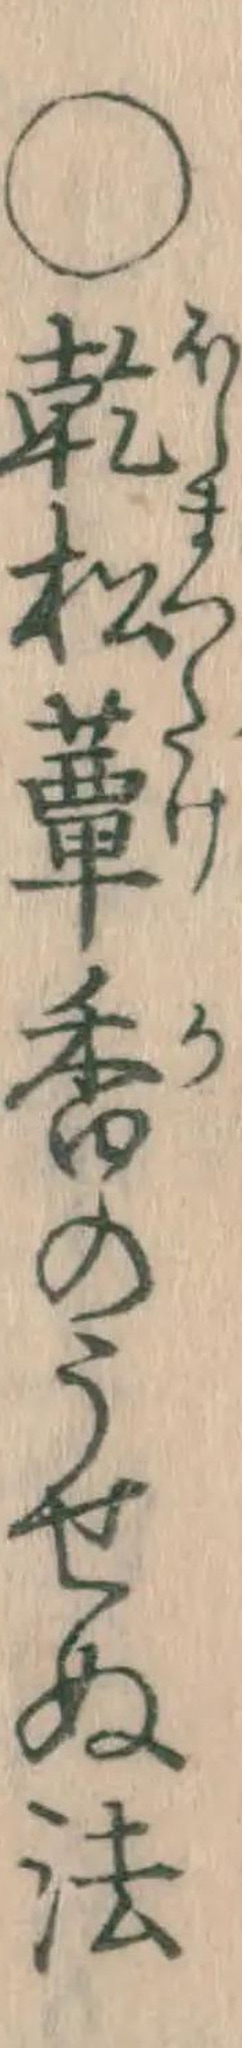○乾松蕈香のうせぬ法
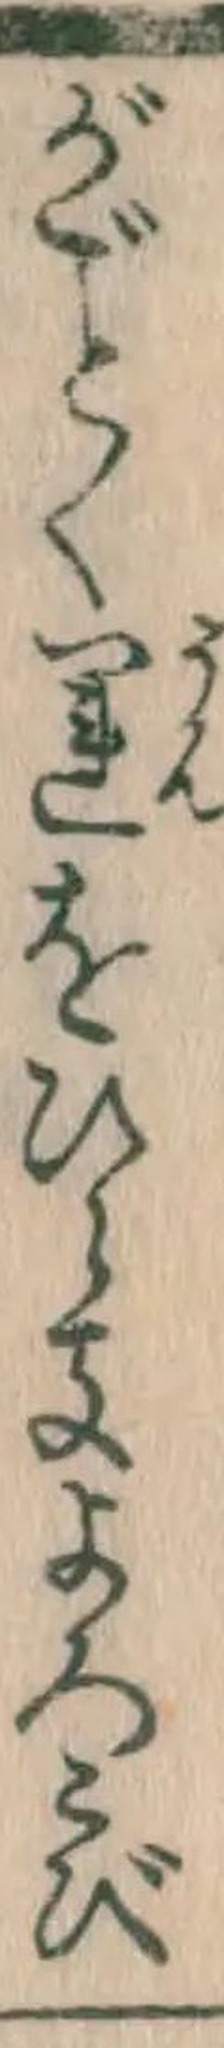がごとく運をひらきよろこび
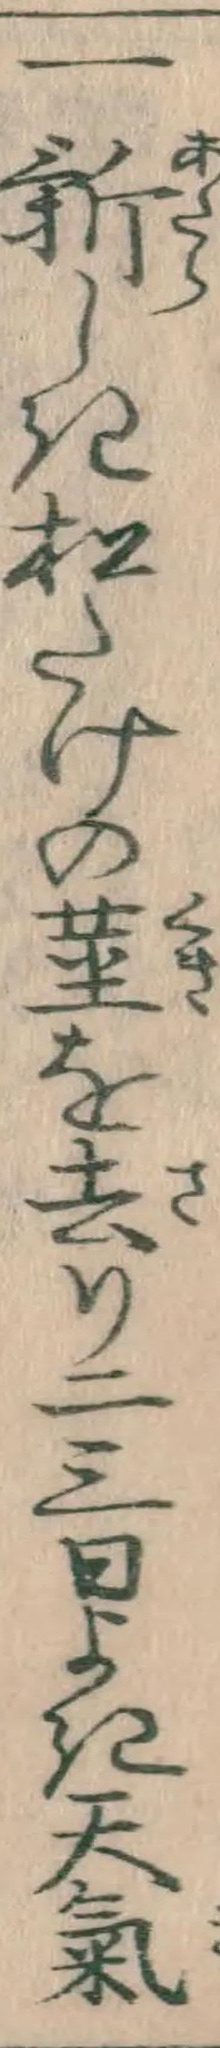一新しき松たけの茎を去り二三日よき天気
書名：広益秘事大全 3巻. [1]
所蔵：国立国会図書館 National Diet Library, JAPAN
